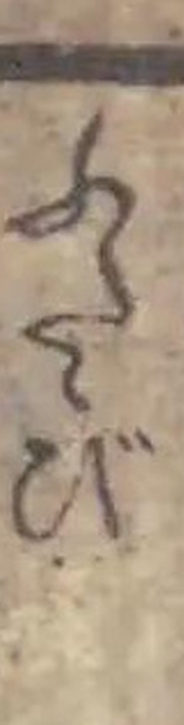ふたゝび
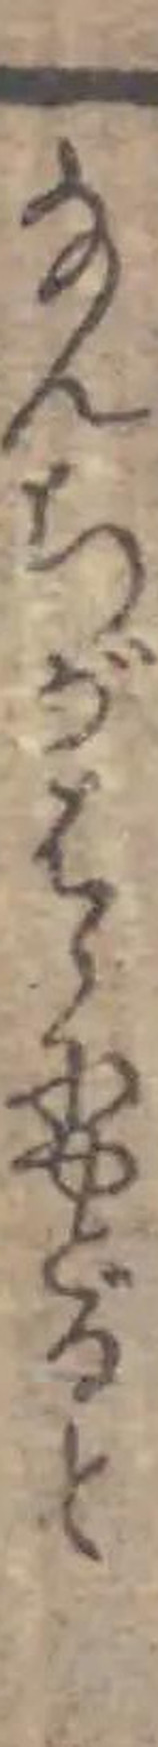なんちがはらにやどると
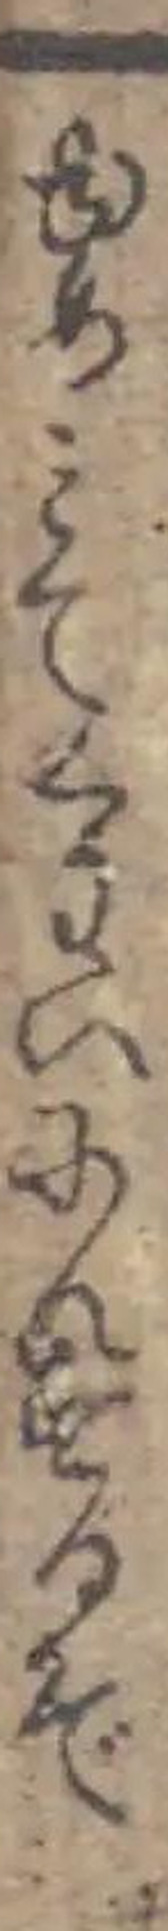ゆめみてくわいにんするぞ
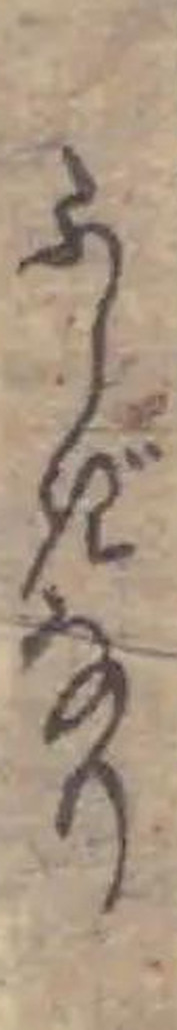ふしぎなり
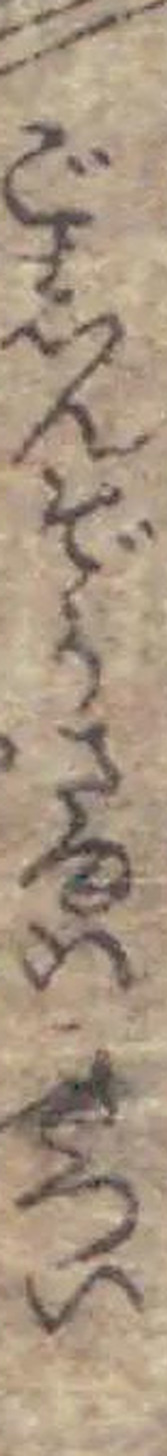ごしんぞうさまはきつい
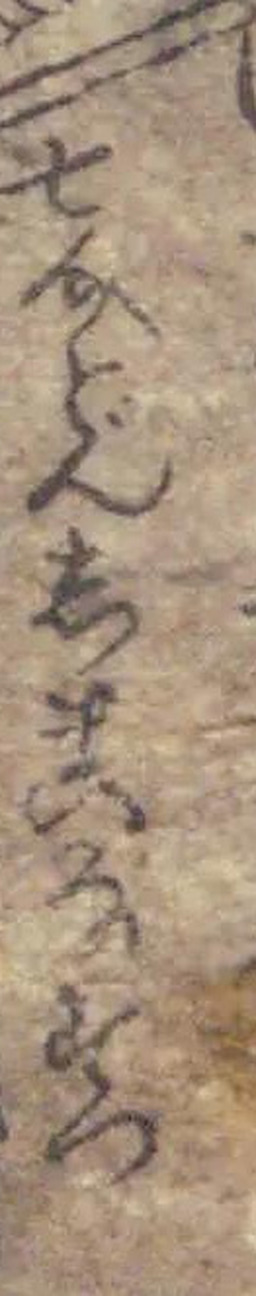七介どんしまいなすつ
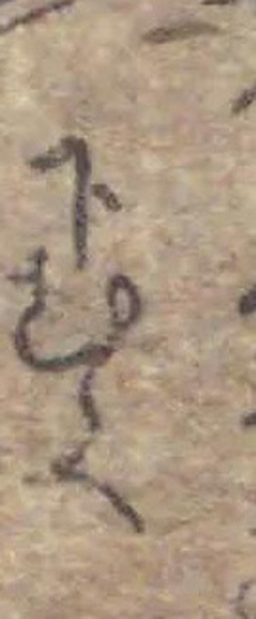下むらへ
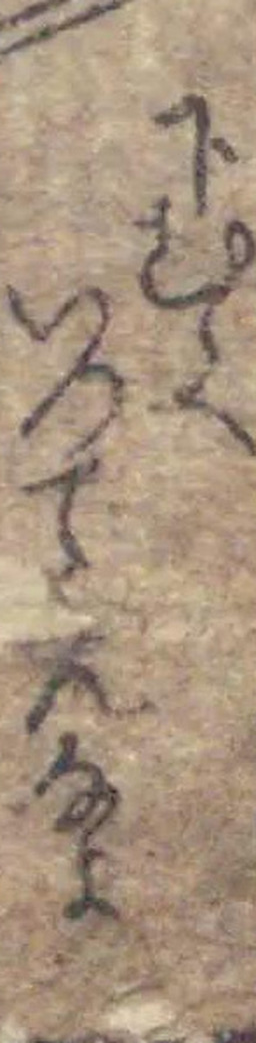いつてくんなよ

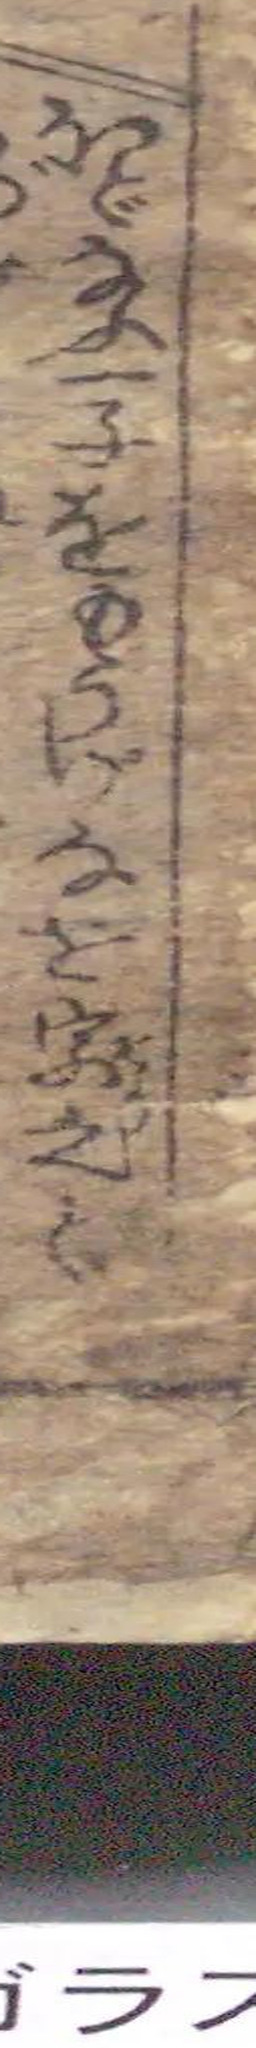ほどなに一子をもうけなを宗之と
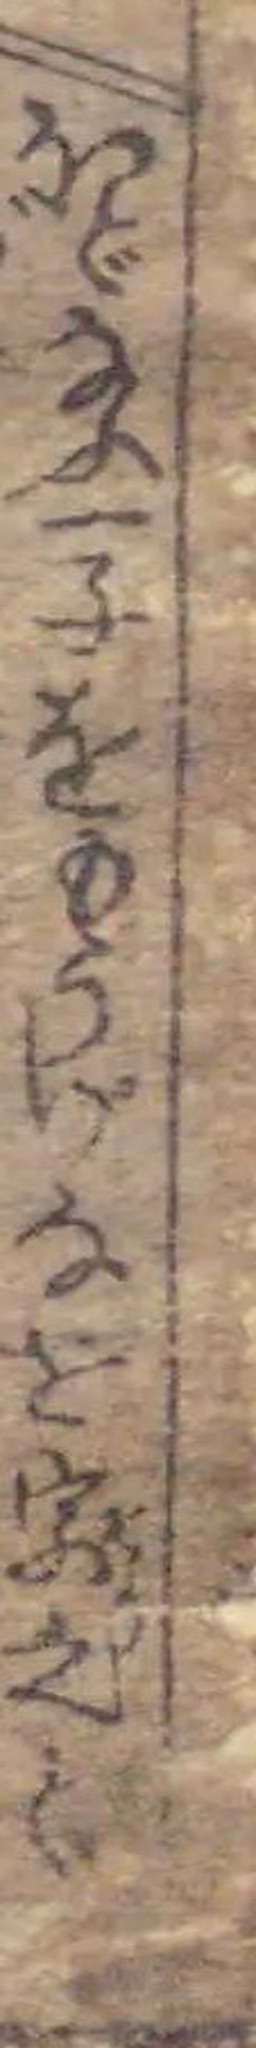ほどなに一子をもうけなを宗之と
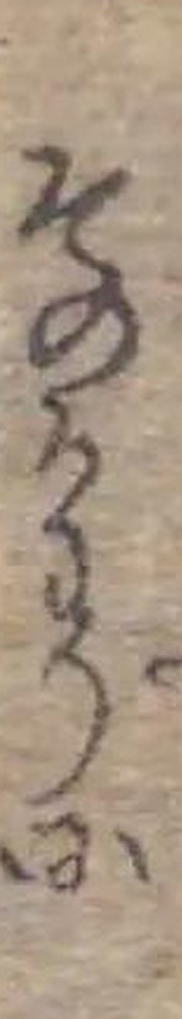そのかわりに
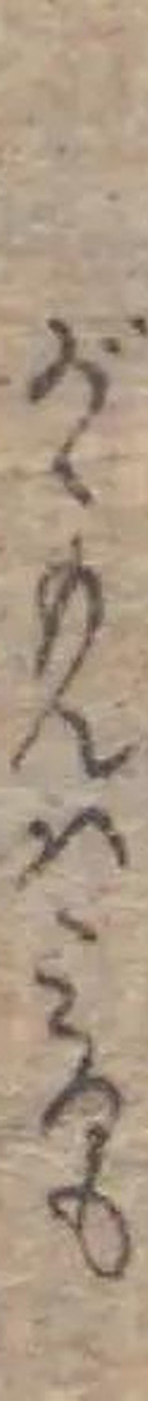がくもんはみるも
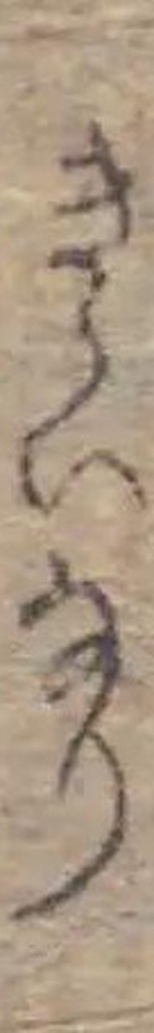きらいなり
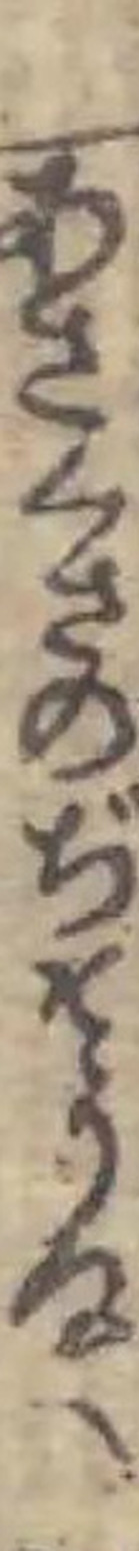あさくさのぢそう寺へ
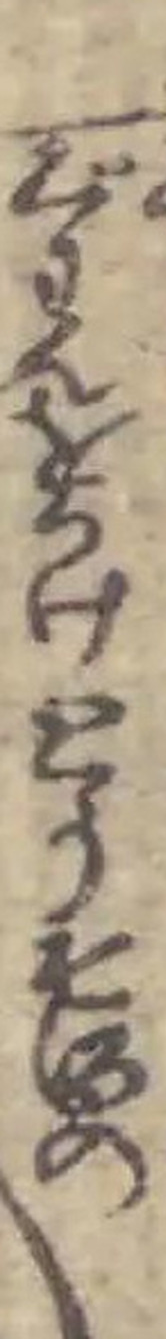ぐわんをかけとうそ酒の
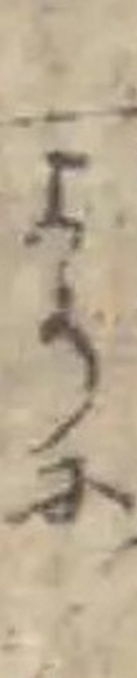ように
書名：飲中八人前 3巻
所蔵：国立国会図書館 National Diet Library, JAPAN
